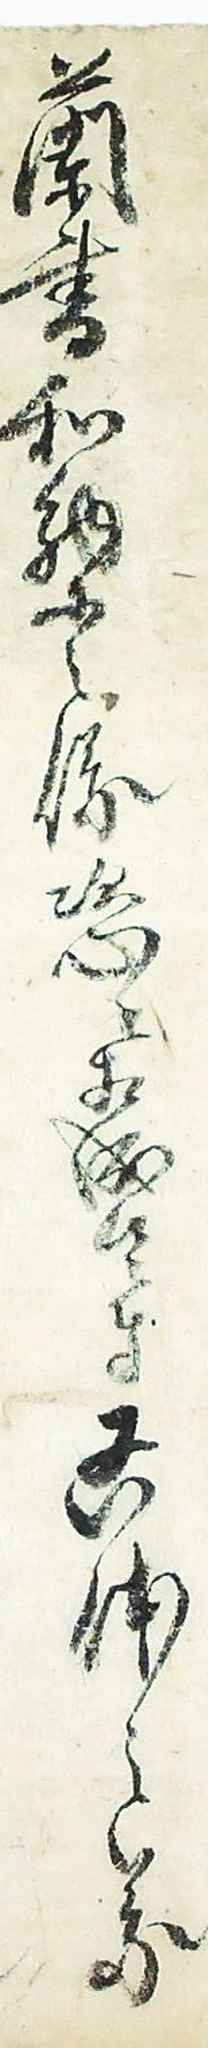蘭書和解等之儀恣ニ相成候ニ付右体之義
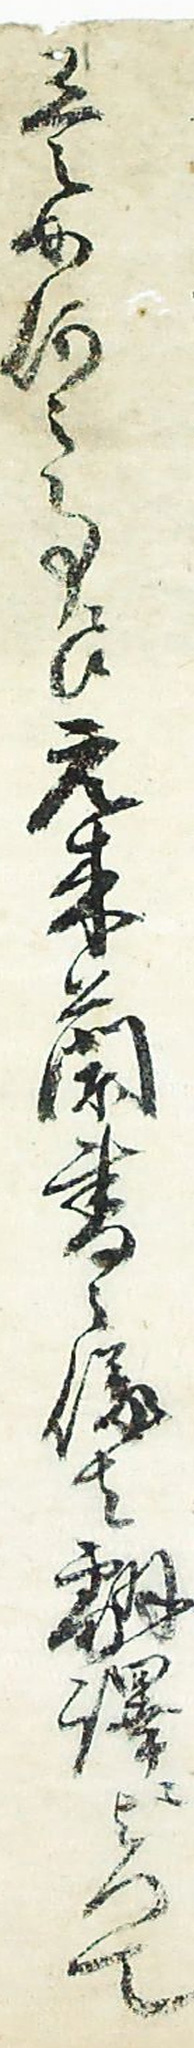有之如何之事ニ候元来蘭書之儀者翻譯ニよつて
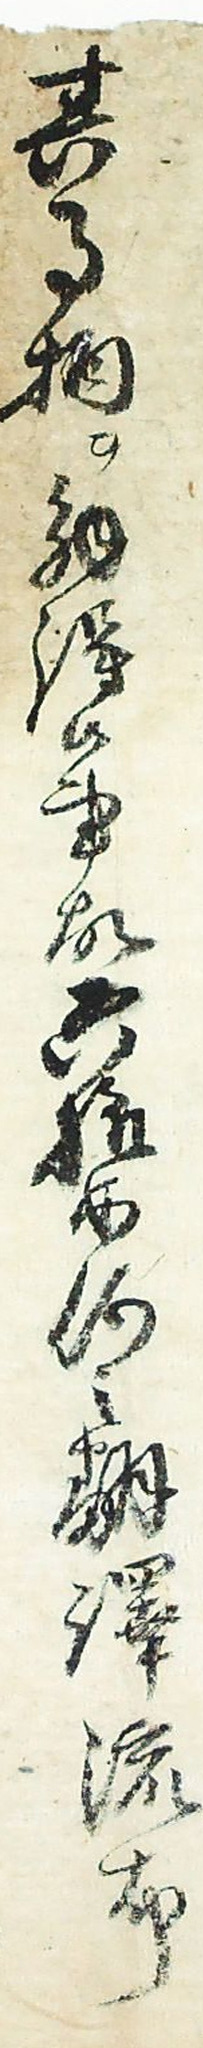其事柄ヲ解得候事故右様如何之翻譯流布
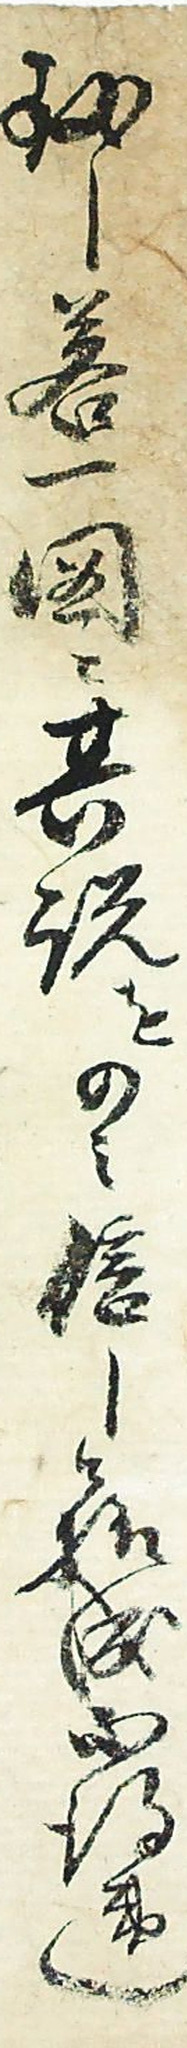致し若一図ニ其説をのみ信し候様成心得違
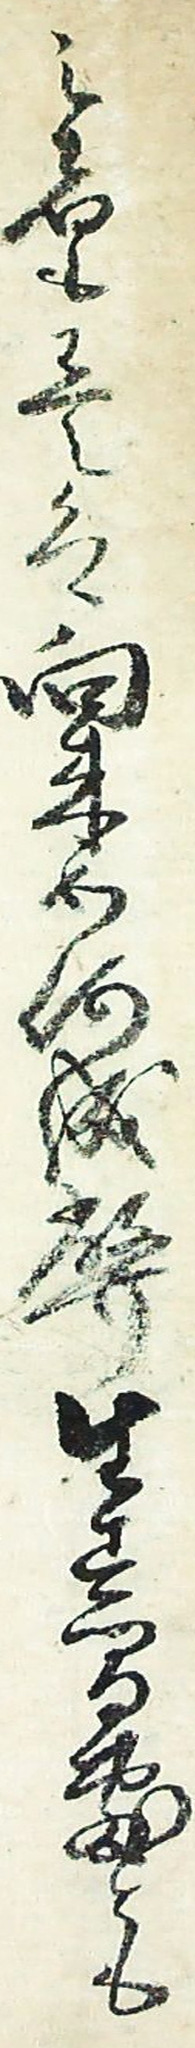之者も有之候ハヽ向来如何成弊生す間敷とも
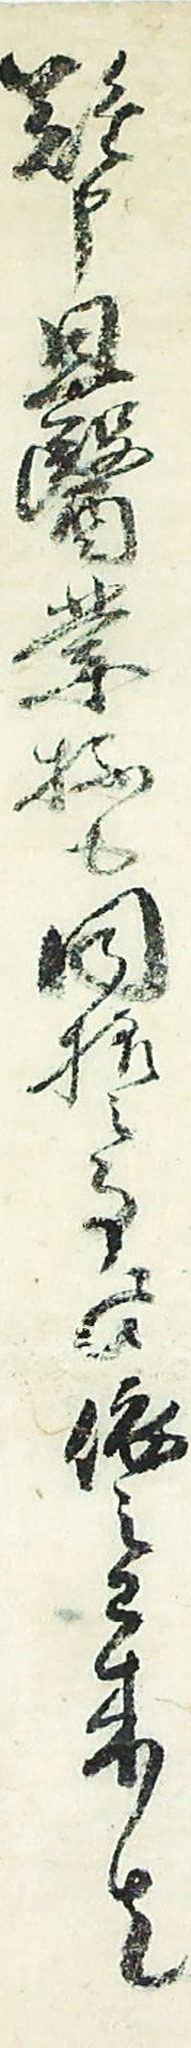難申且醫業抔も同様之事ニ候依之已来者
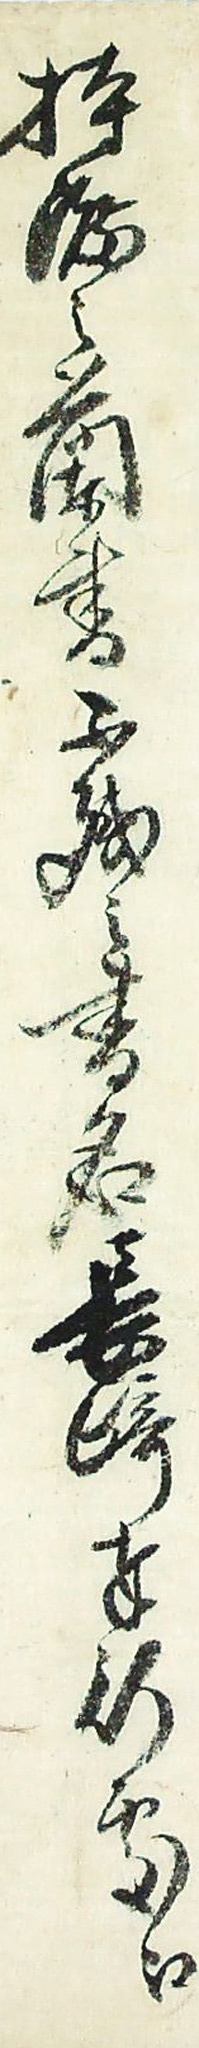持渡之蘭書不残之書名長崎奉行處江
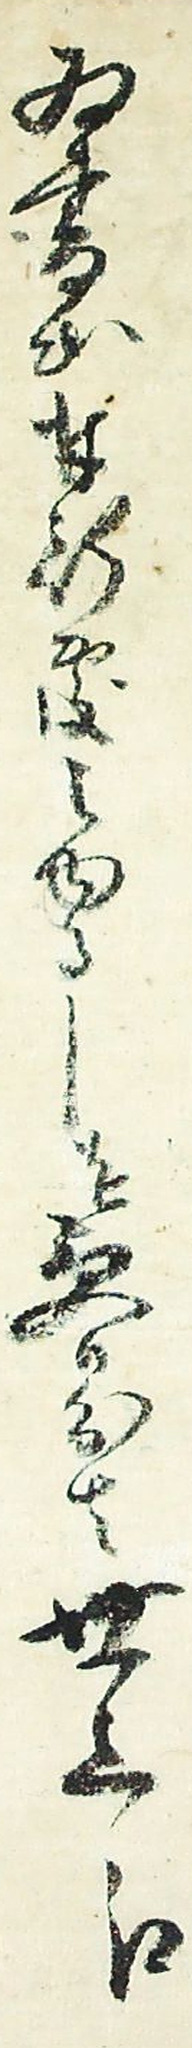為書出奉行處之ゆるしを受候分者世上江
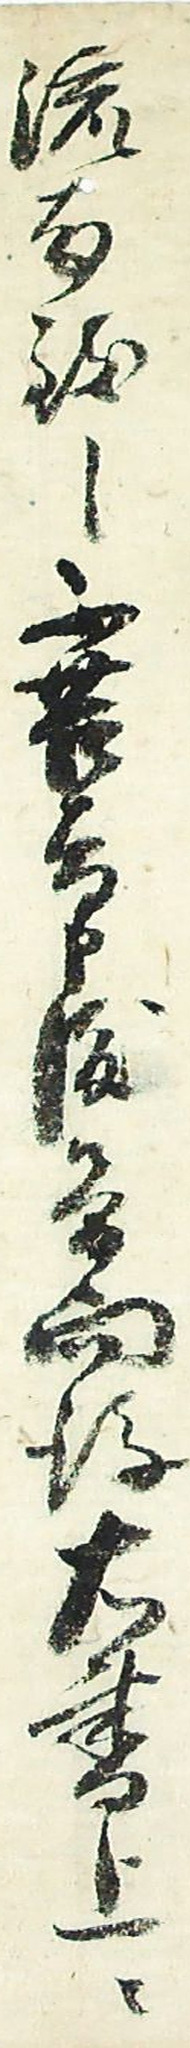流布致し不苦旨申渡候間向後右書上ニ
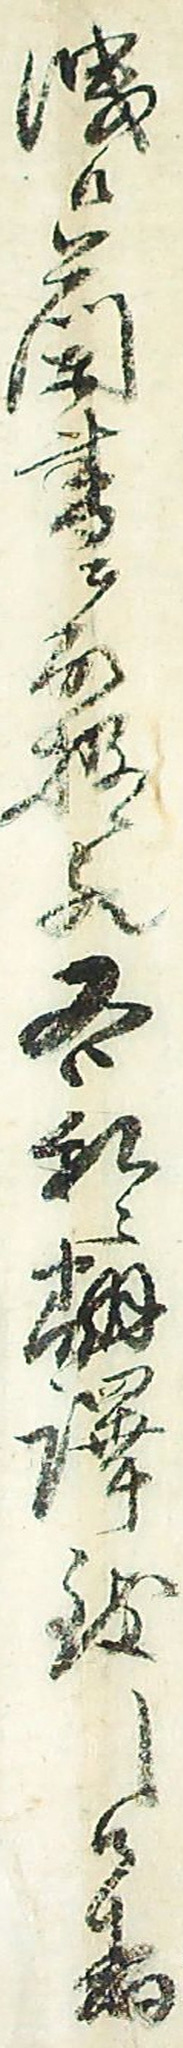洩候蘭書ヲ取扱候歟又ハ私ニ翻譯致し候者
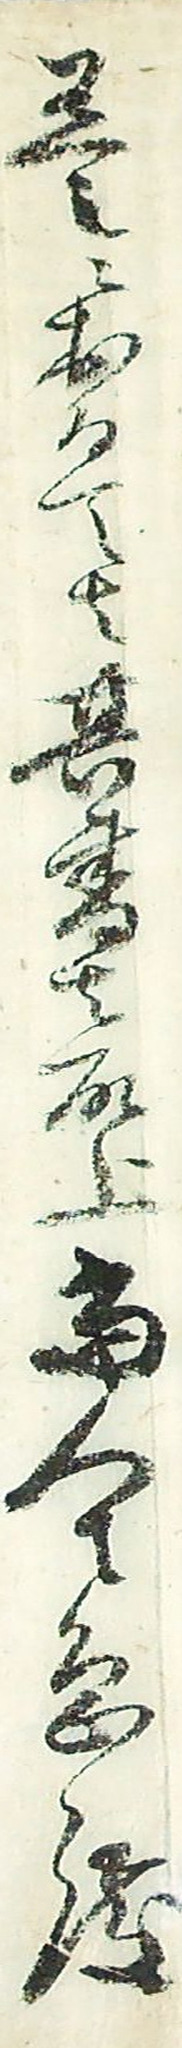有之ニおゐて者其書者取上當人者急度
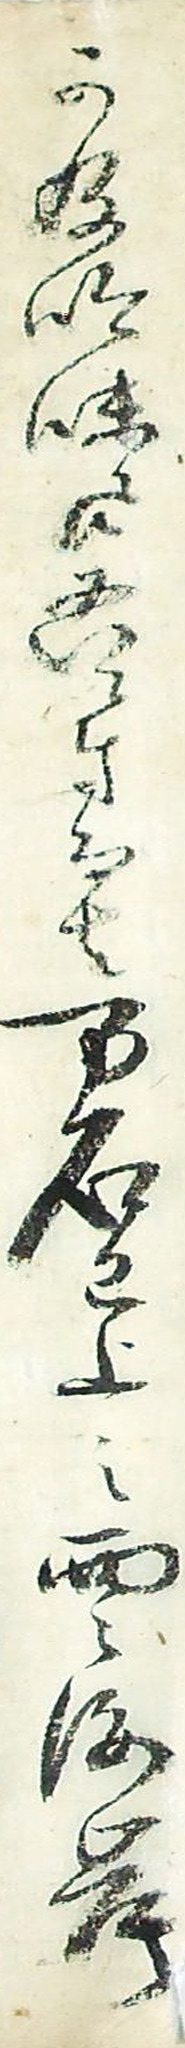可及吟味ニ候右ニ付而者万石已上之西之海岸
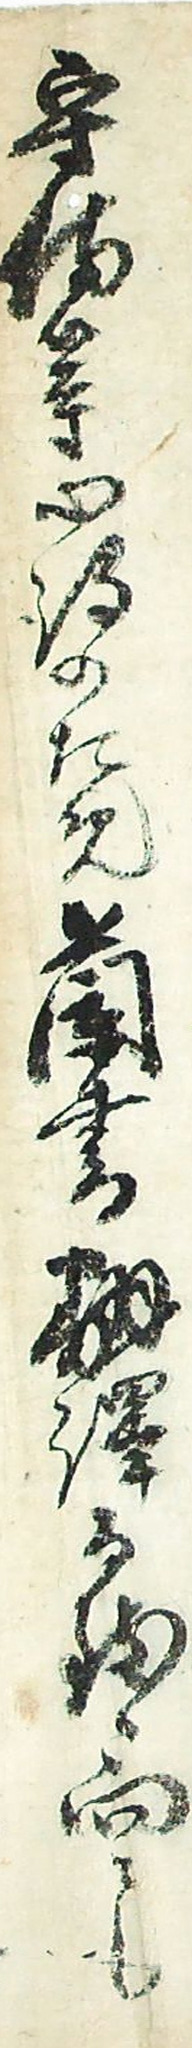守備等心得のため蘭書翻譯為致候向ニも
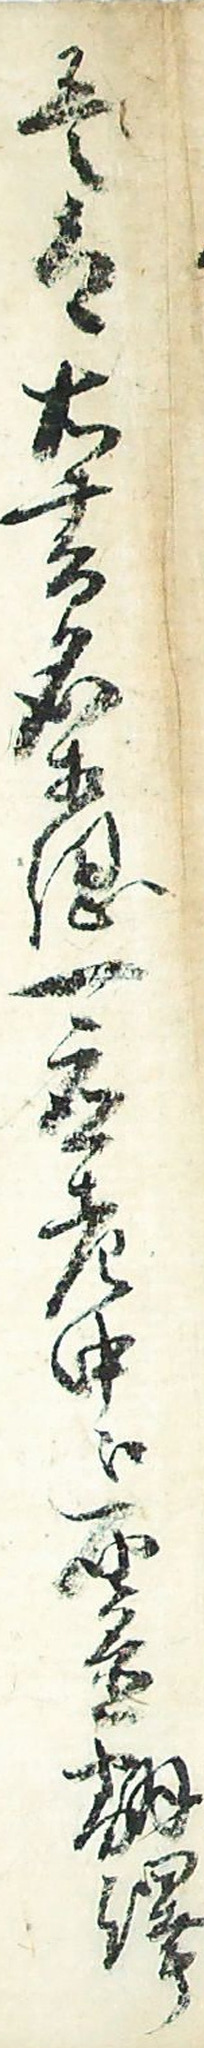有之候ハヽ右書名相認一応老中江届置翻譯
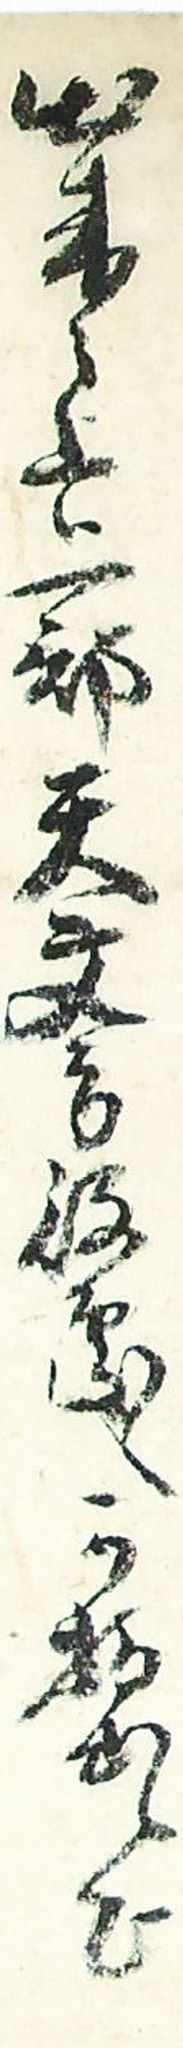出来之上ハ一部天文方役處へ可指出候以上
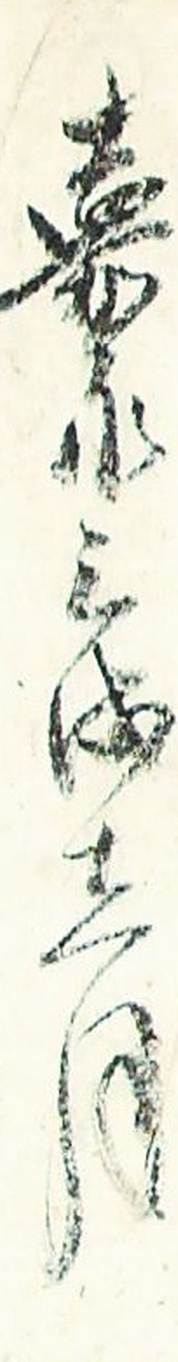嘉永三戌十一月
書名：諸御趣意書并御下知向之写
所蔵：鳴門教育大学 Naruto University of Education
